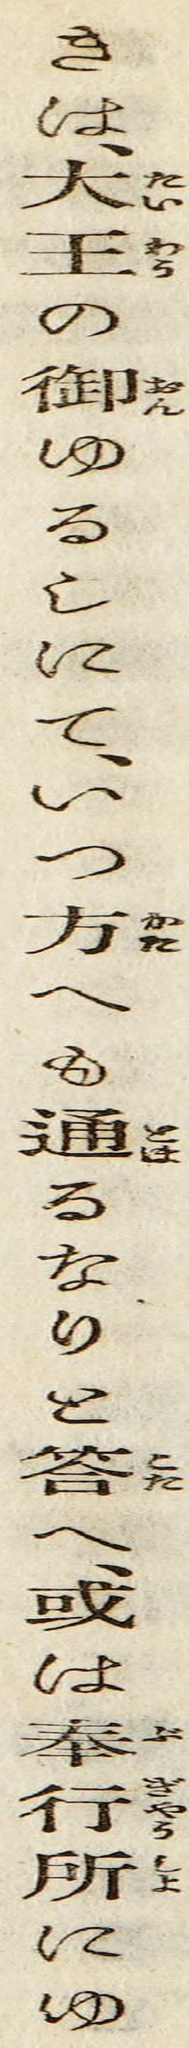きは、大王の御ゆるしにて、いつ方へも通るなりと答へ、或は奉行所にゆ
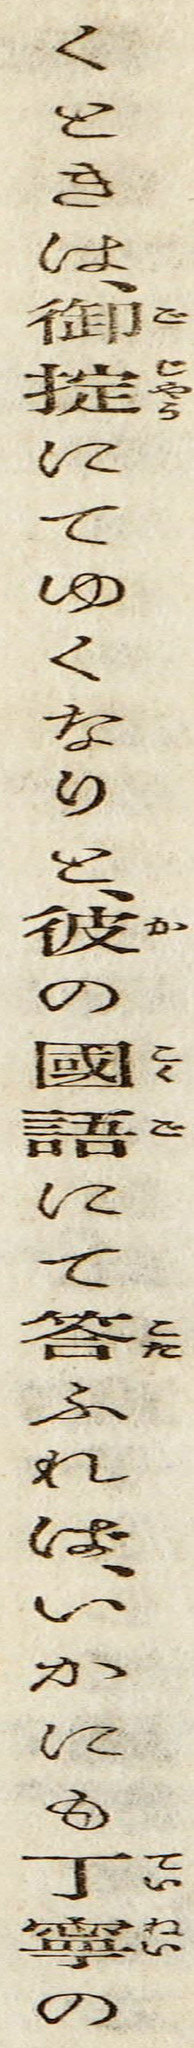くときは、御掟にてゆくなりと、彼の国語にて答ふれば、いかにも丁寧の
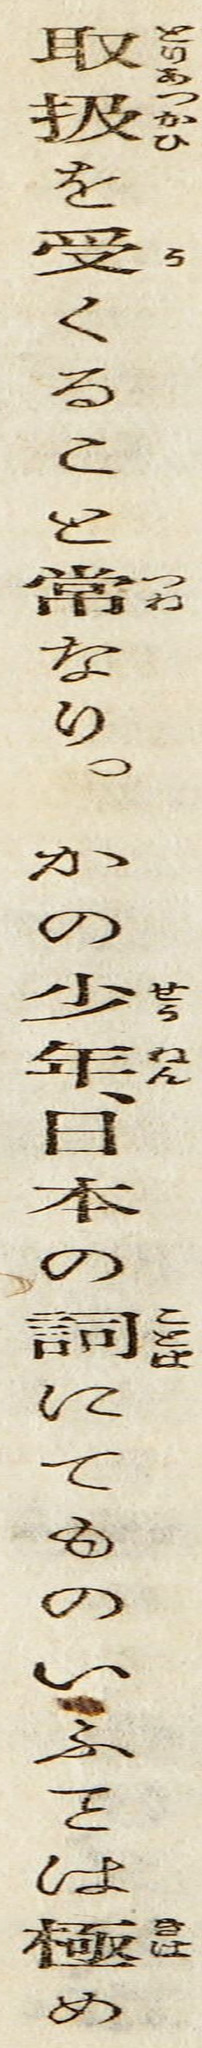取扱を受くること常なり。かの少年、日本の詞にてものいふことは極め
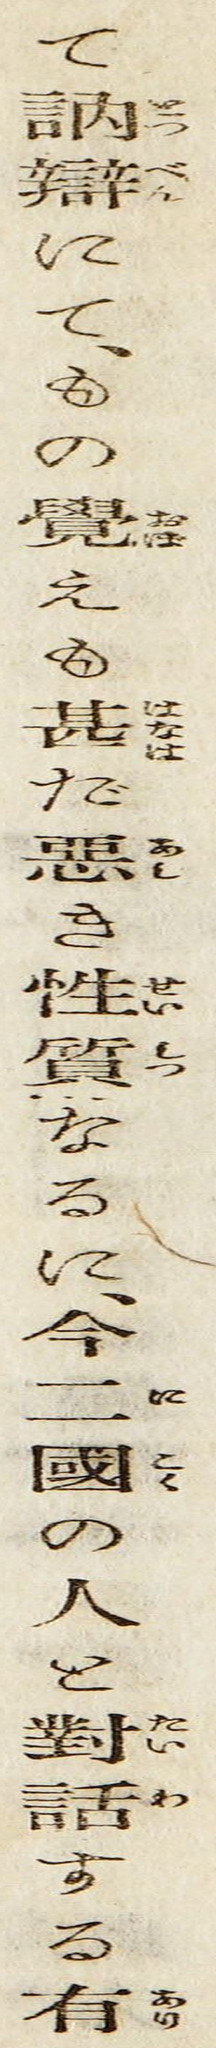て訥弁にて、もの覚えも甚だ悪き性質なるに、今二国の人と対話する有
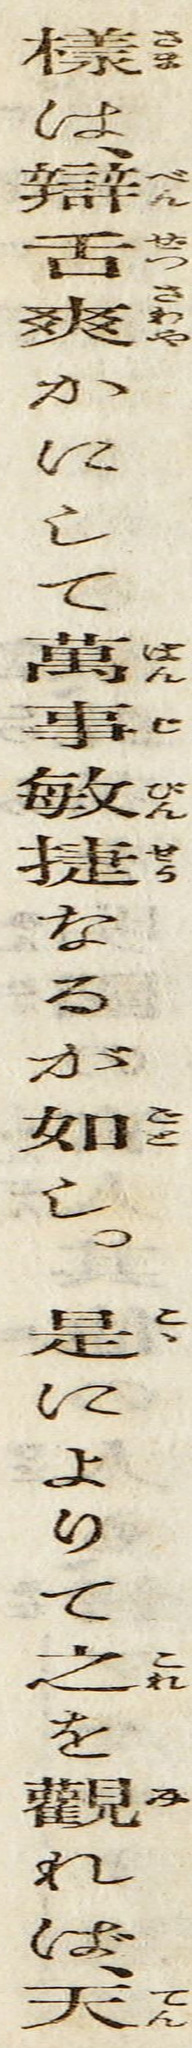様は、弁舌爽かにして万事敏捷なるが如し。是によりて之を観れば、天
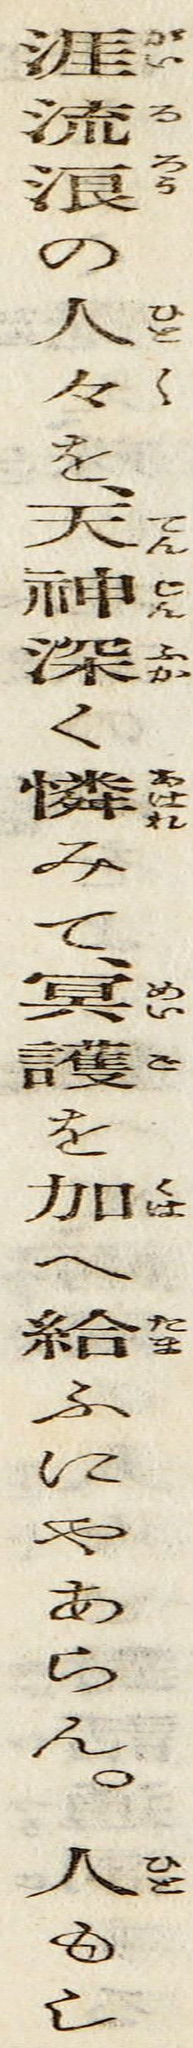涯流浪の人々を、天神深く憐みて、冥護を加へ給ふにやあらん。人もし
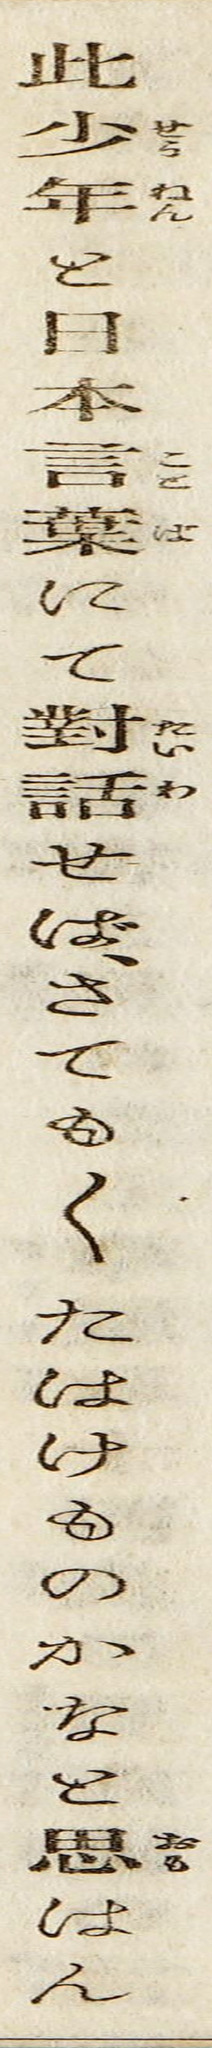此少年と日本言葉にて対話せば、さても〳〵たはけものかなと思はん
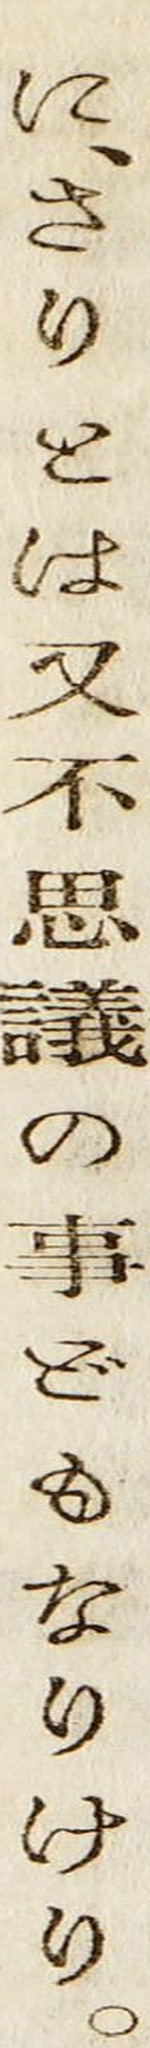に、さりとは又不思議の事どもなりけり。
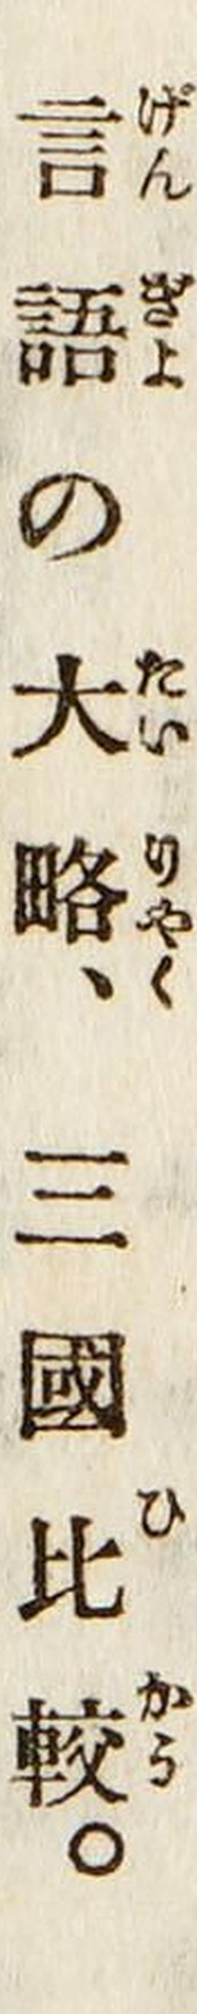言語の大略、三国比較。

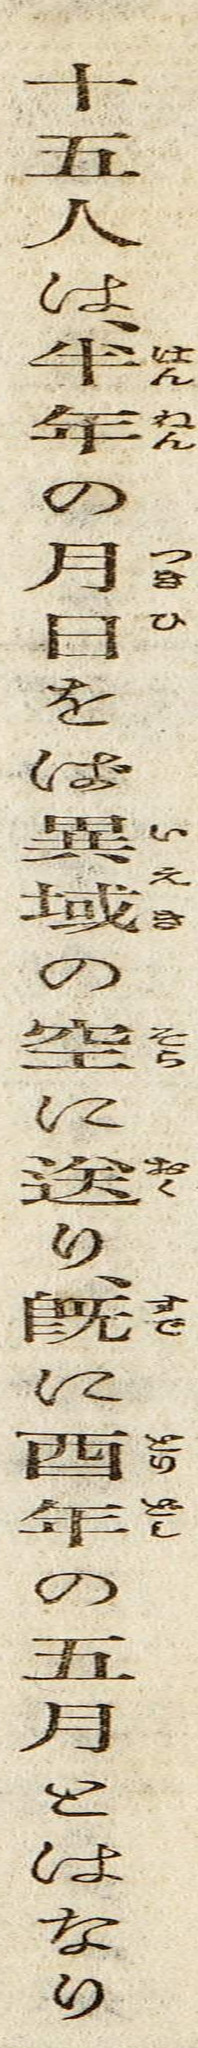十五人は、半年の月日をば異域の空に送り、既に酉年の五月とはなり
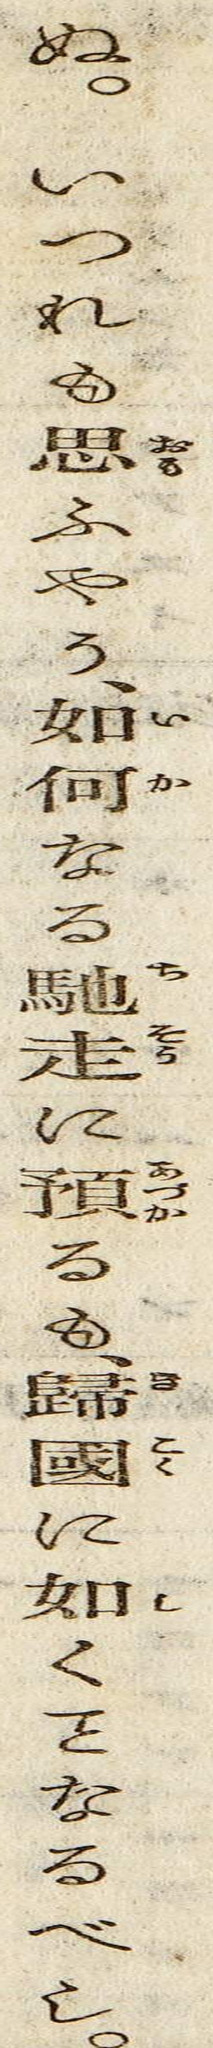ぬ。いつれも思ふやう、如何なる馳走に預るも、帰国に如くことなるべし。
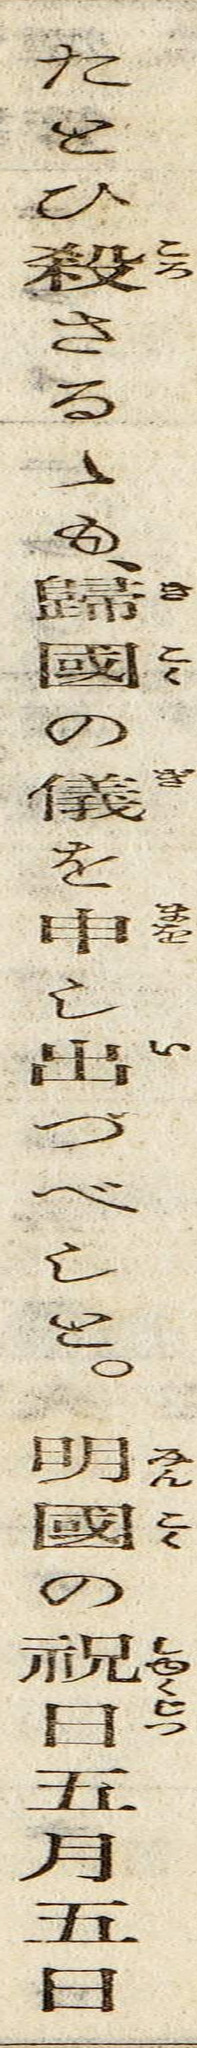たとひ殺さるゝも、帰国の儀を申し出づべしと。明国の祝日五月五日
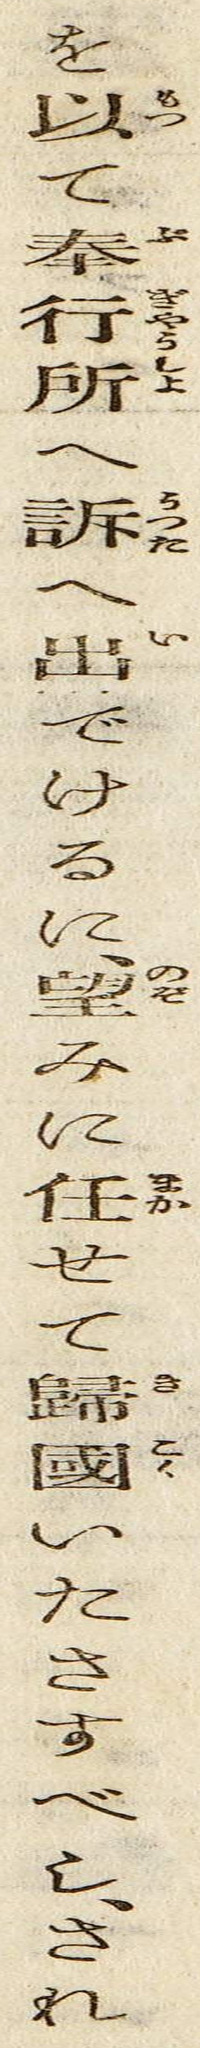を以て奉行所へ訴へ出でけるに、望みに任せて帰国いたさすべし、され
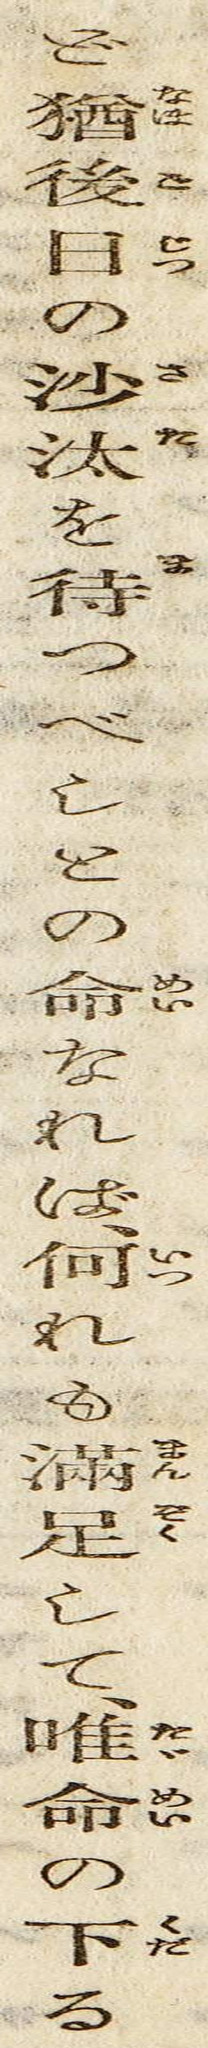ど猶後日の沙汰を待つべしとの命なれば、何れも満足して、唯命の下る
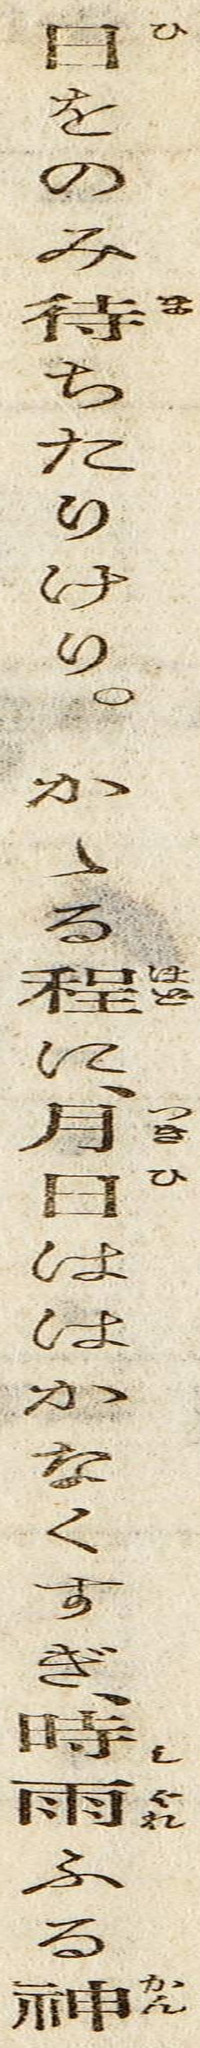日をのみ待ちたりけり。かゝる程に、月日ははかなくすぎ、時雨ふる神
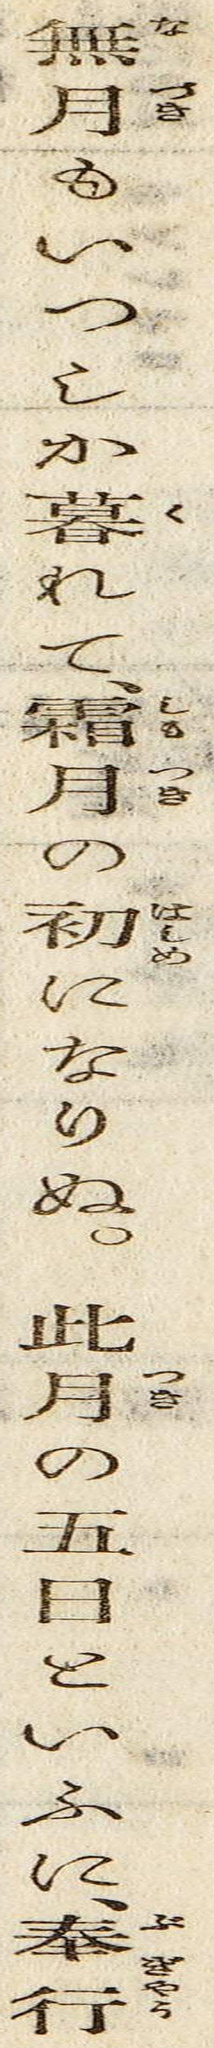無月もいつしか暮れて、霜月の初になりぬ。此月の五日といふに、奉行
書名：日本漂流譚
